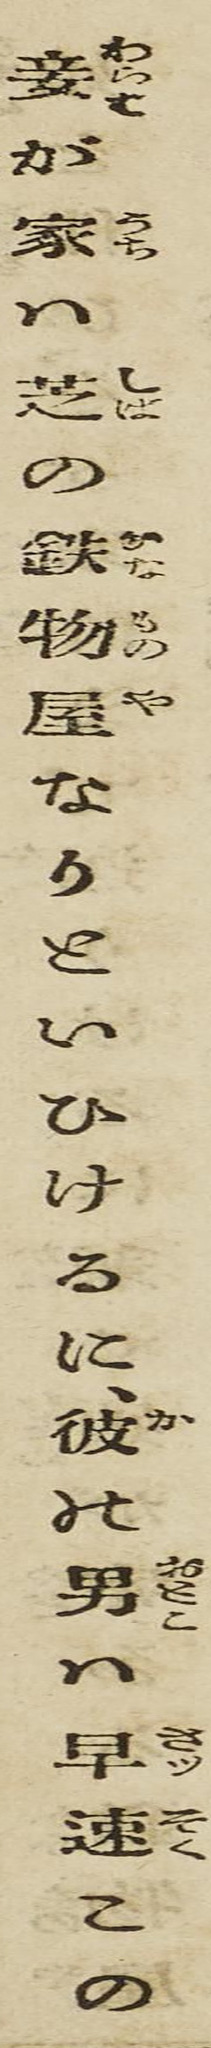妾が家は芝の金物屋なりといひけるに、彼の男は早速この

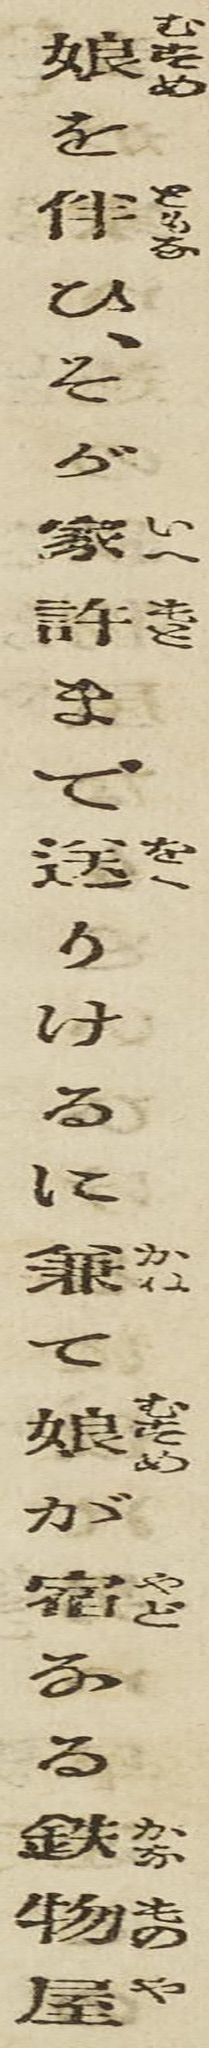娘を伴ひ、そが家許まで送りけるに兼て娘が宿なる金物屋
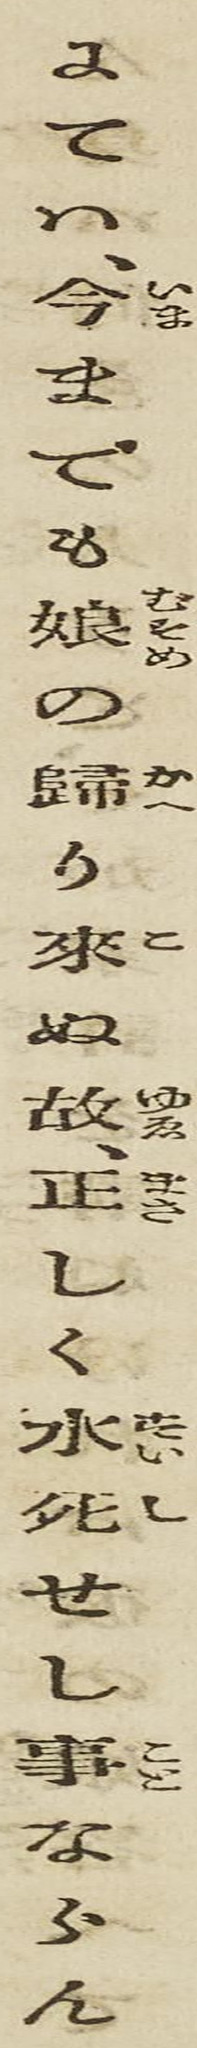にては、今までも娘の帰り来ぬ故、正しく水死せし事ならん
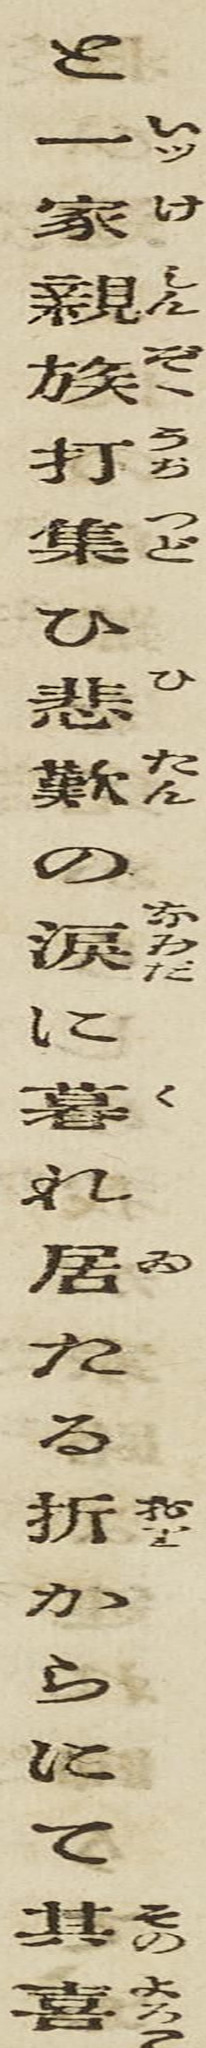と一家親族打集ひ悲嘆の涙に暮れ居たる折からにて其喜
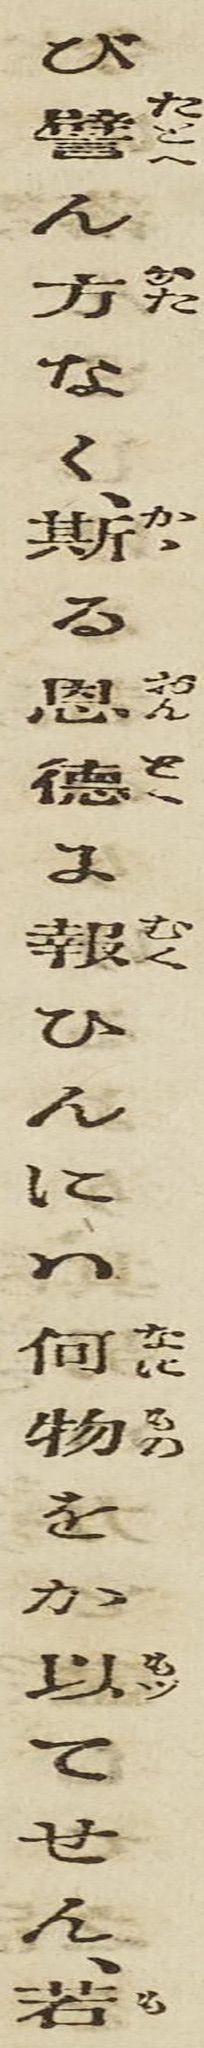び譬ん方なく、斯る恩徳に報ひんには何物をか以てせん、若
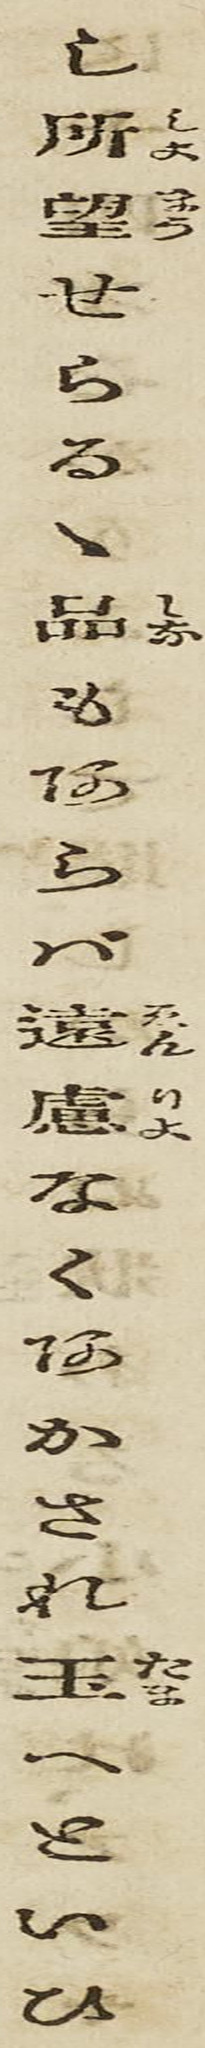し所望せらるゝ品もあらば遠慮なくあかされ玉へといひ
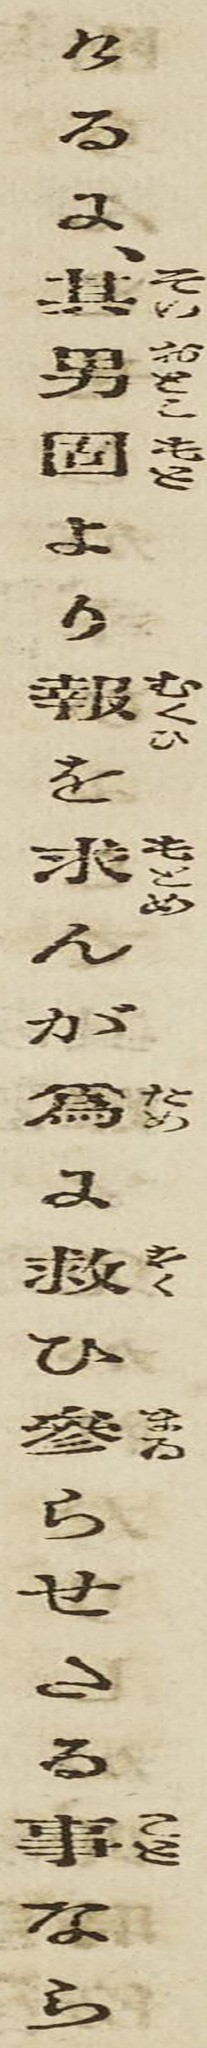けるに、其男固より報を求んが為に救ひ参らせたる事なら
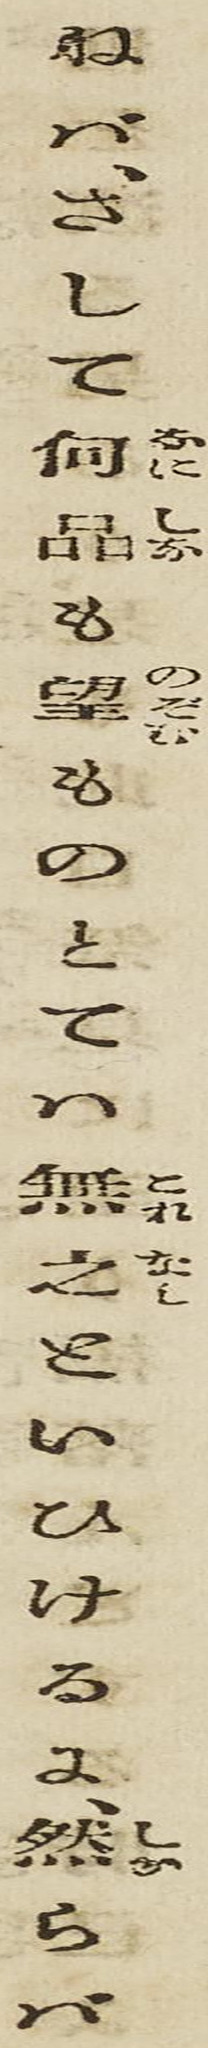ねば、さして何品も望ものとては無之といひけるに、然らば
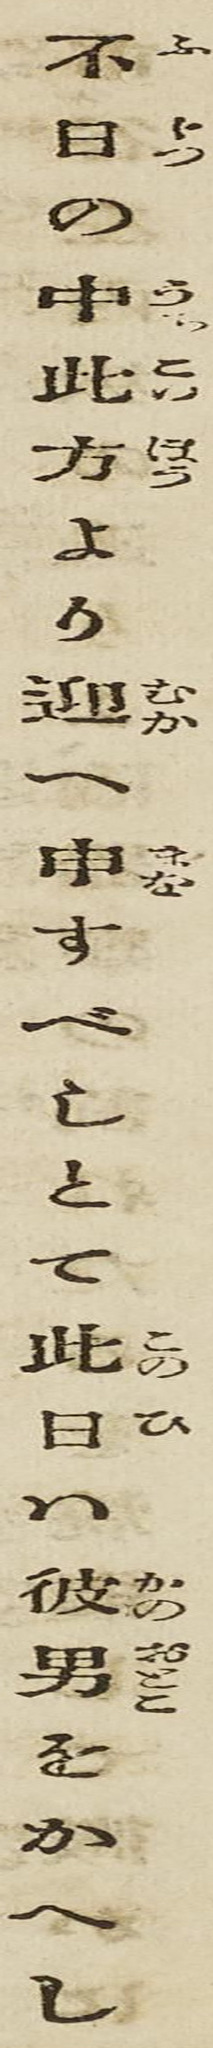不日の中此方より迎へ申すべしとて此日は彼男をかへし
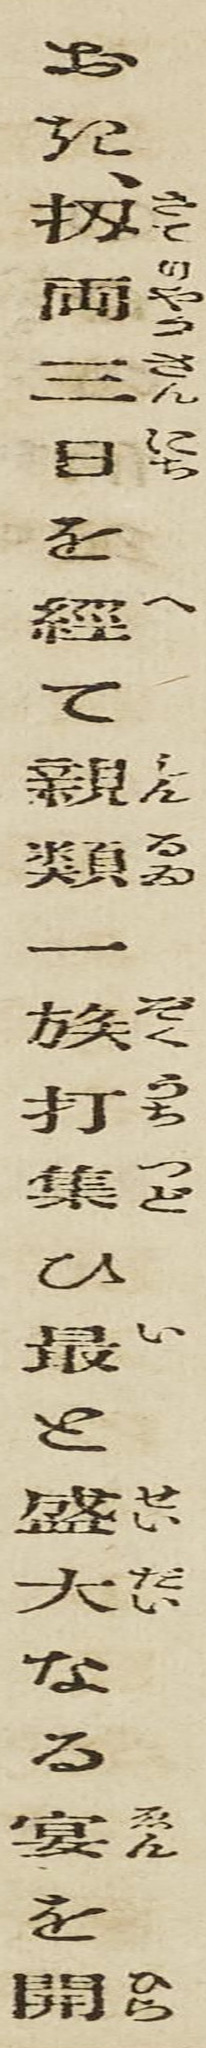おき、扨両三日を経て親類一族打集ひ最と盛大なる宴を開
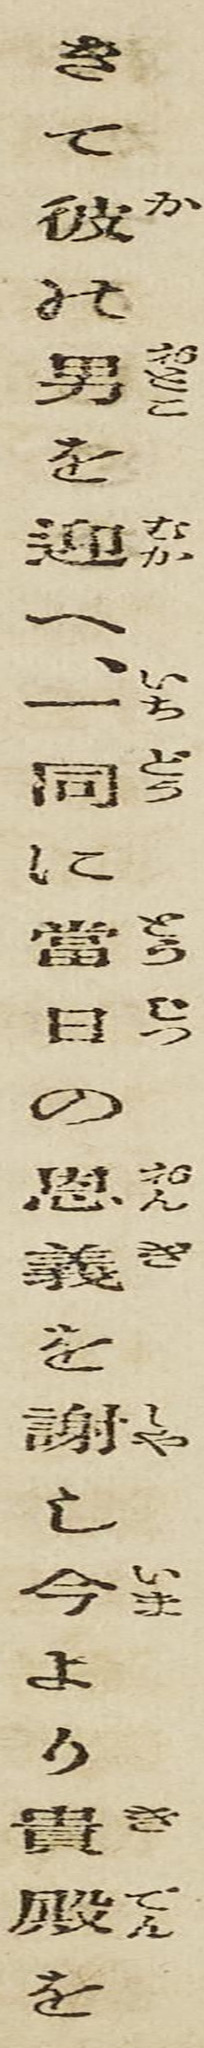きて彼の男を迎へ、一同に当日の恩義を謝し今より貴殿を
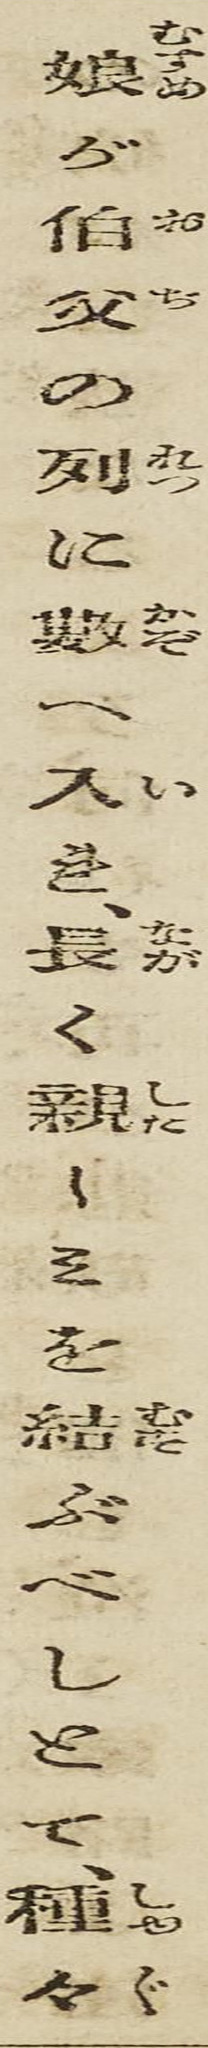娘が伯父の列に数へ入れ、長く親しみを結ぶべしとて、種々
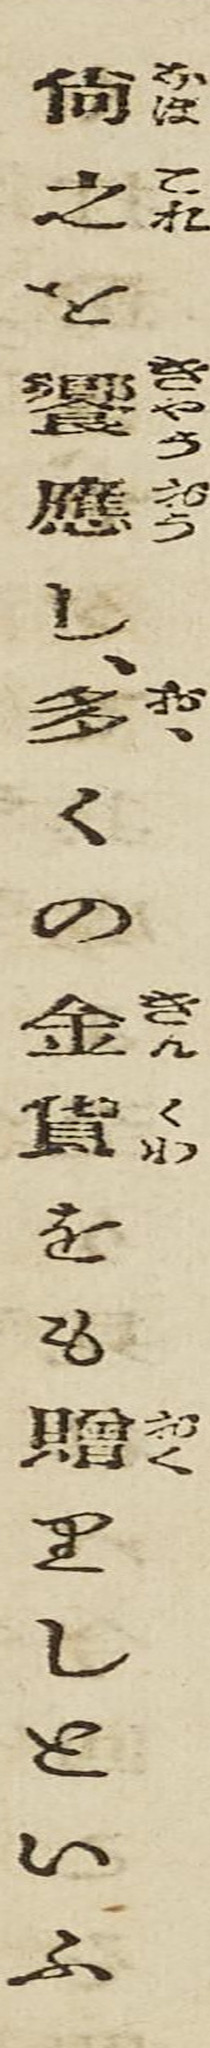猶之を饗応し、多くの金貨をも贈りしといふ
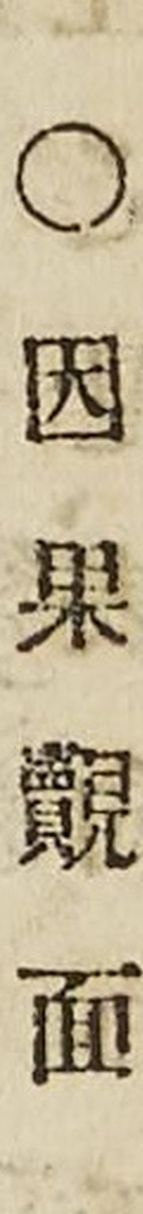○因果覿面
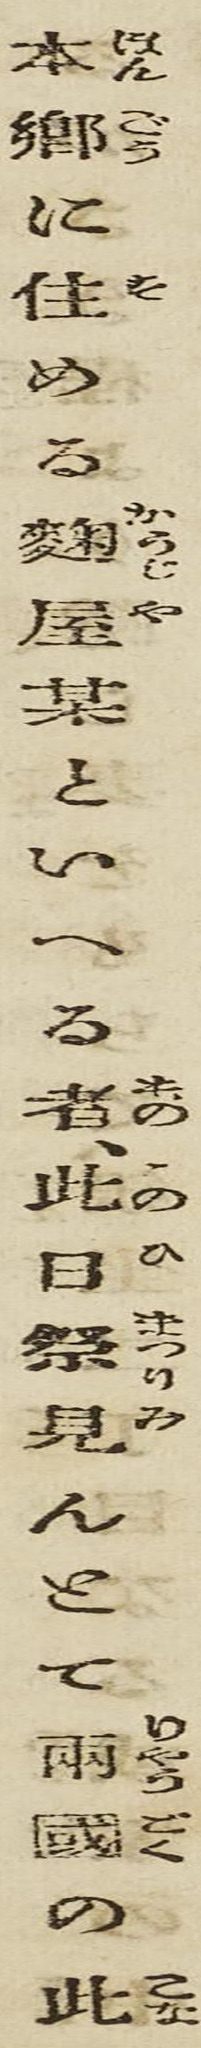本郷に住める麹屋某といへる者、此日祭見んとて両国の此
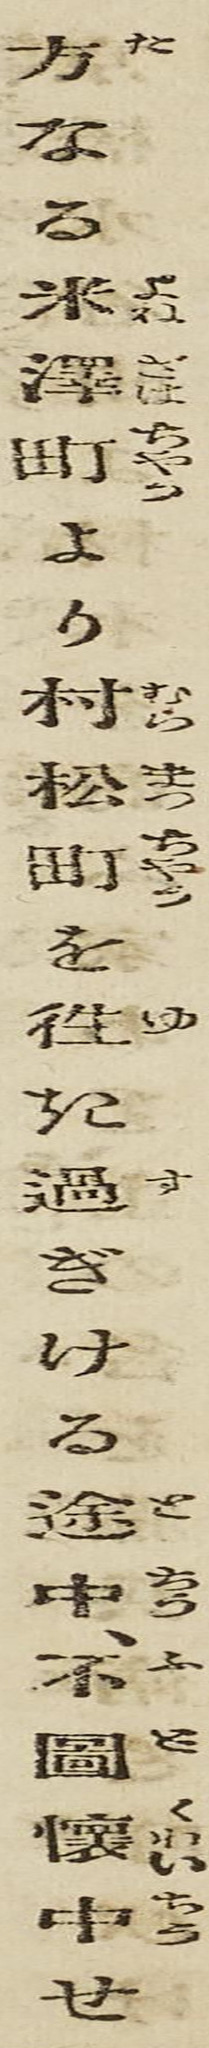方なる米沢町より村松町を往き過ぎける途中、不図懐中せ
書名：永代惨話　文化の夢　全
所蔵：東京大学地震研究所図書室 Earthquake Research Institute Library, The University of Tokyo, JAPAN
